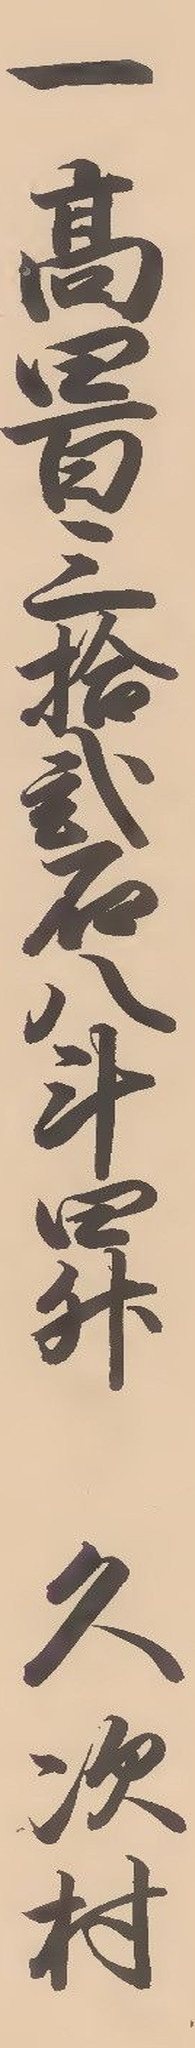一高四百三拾弐石八斗四升久次村

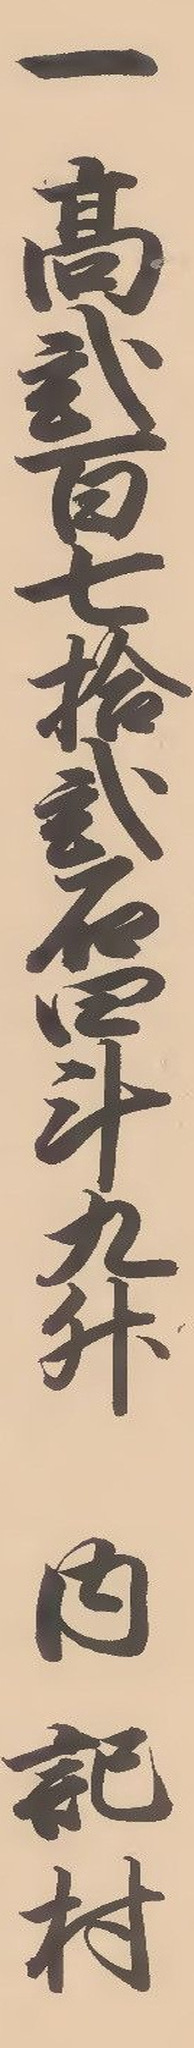一高弐百七拾弐石四斗九升内記村
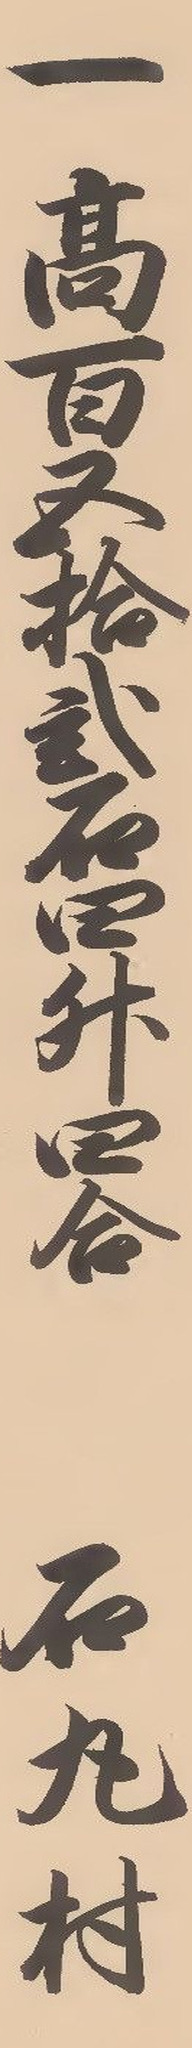一高百五拾弐石四升四合石丸村
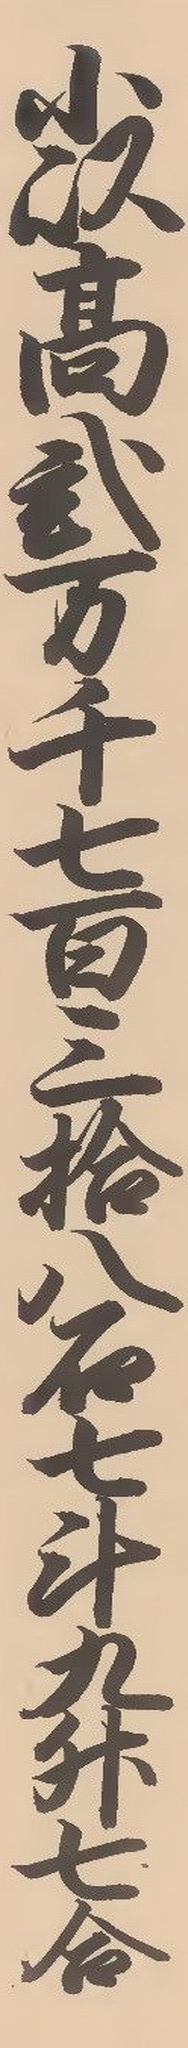小以高弐万千七百三拾八石七斗九升七合
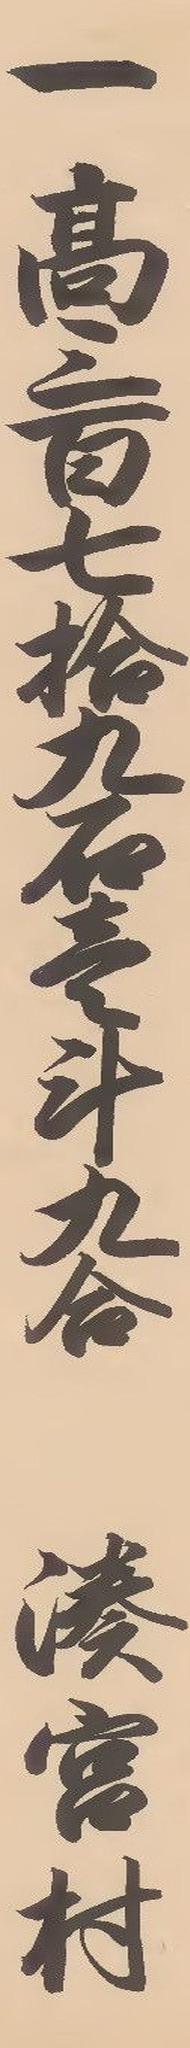一高三百七拾九石壱斗九合湊宮村

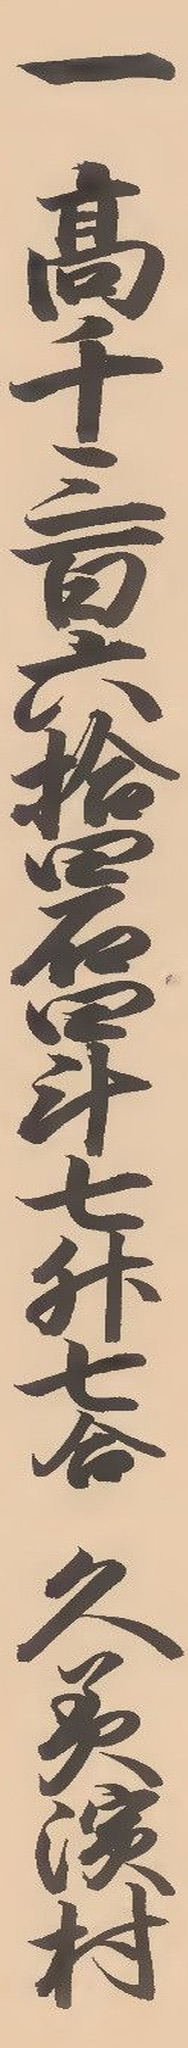一高千三百六拾四石四斗七升七合久美浜村
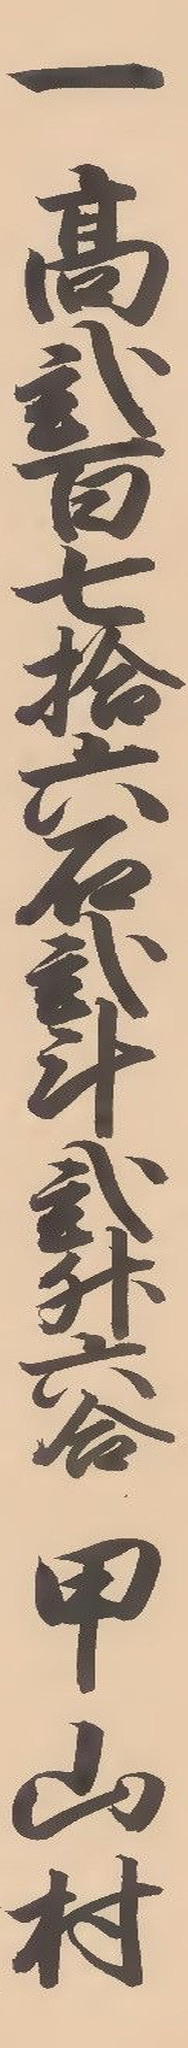一高弐百七拾六石弐斗弐升六合甲山村
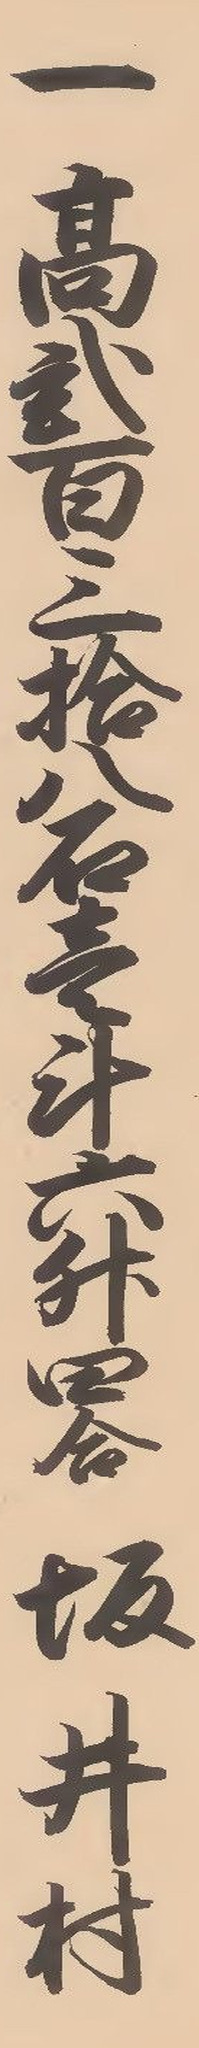一高弐百三拾八石壱斗六升四合坂井村
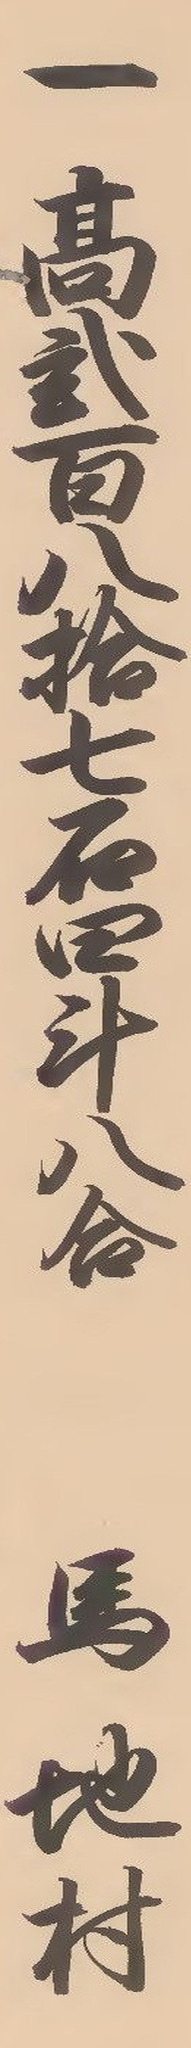一高弐百八拾七石四斗八合馬地村

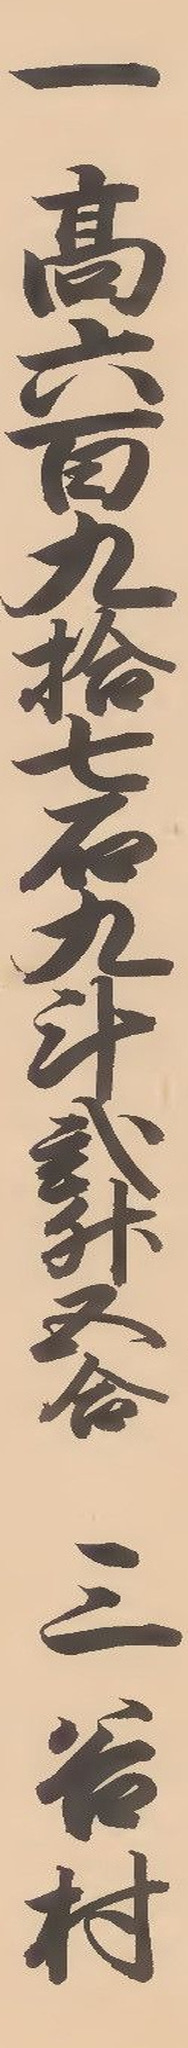一高六百九拾七石九斗弐升五合三谷村
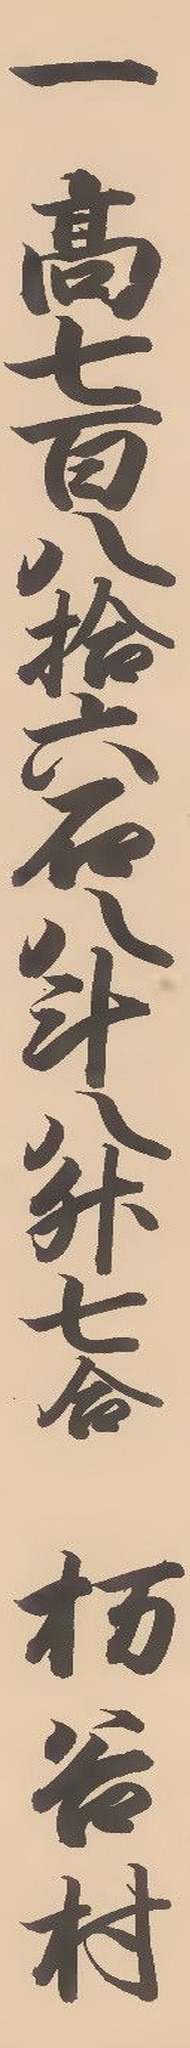一高七百八拾六石八斗八升七合栃谷村
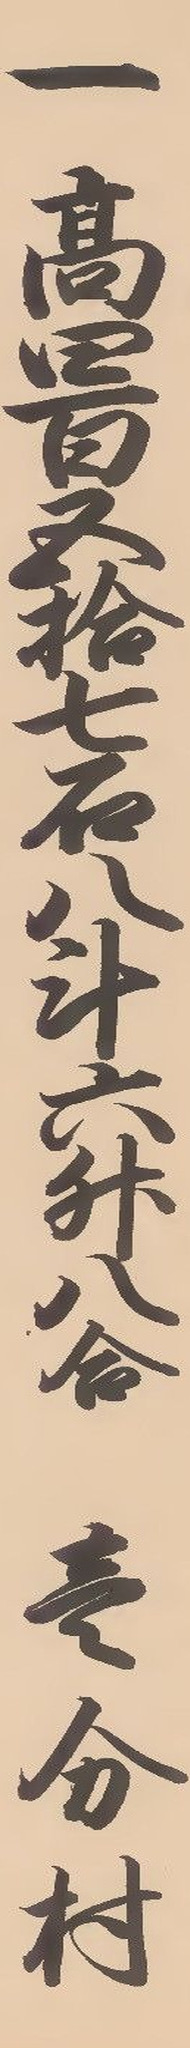一高四百五拾七石八斗六升八合壱分村

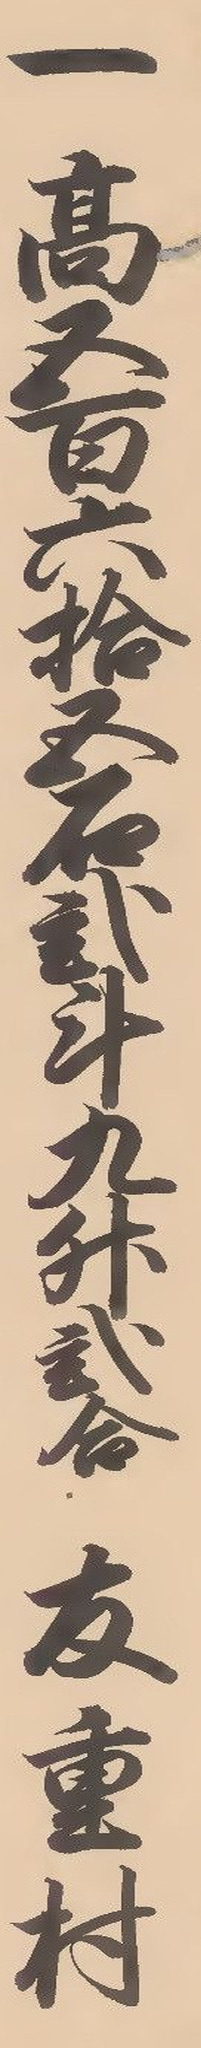一高五百六拾五石弐斗九升弐合友重村
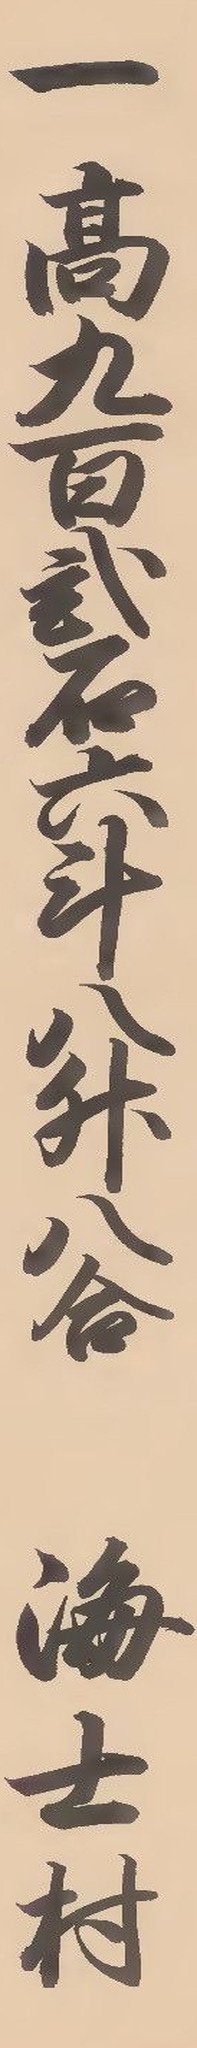一高九百弐石六斗八升八合海士村
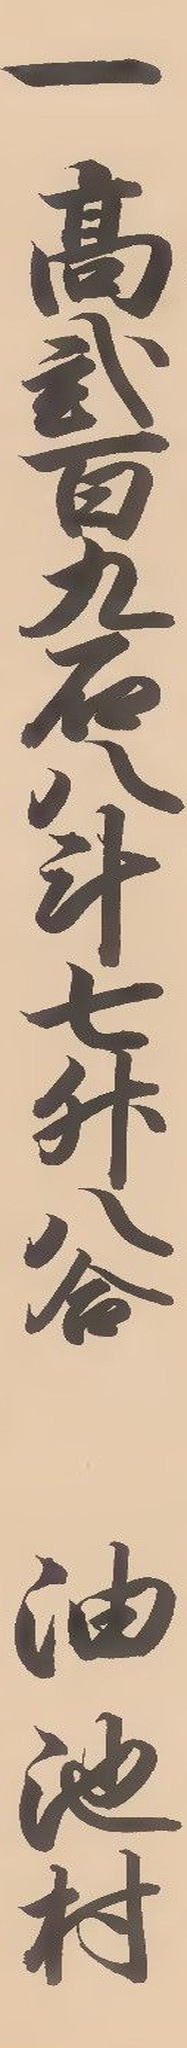一高弐百九石八斗七升八合油池村
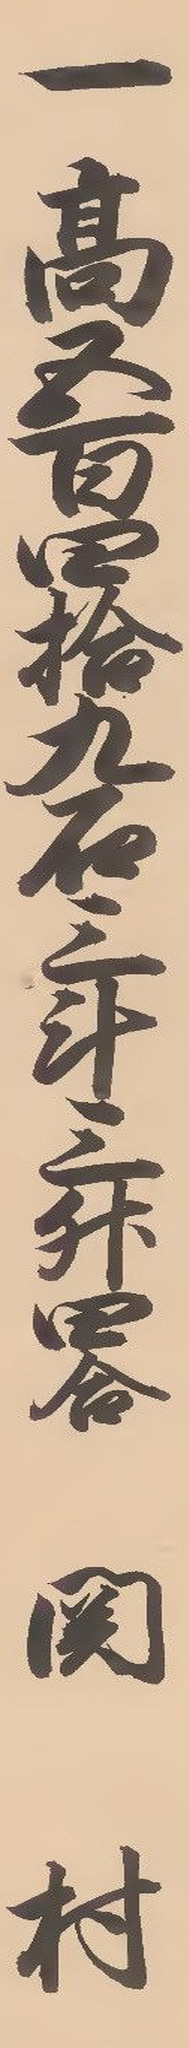一高五百四拾九石三斗三升四合関村
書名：丹後国郷帳
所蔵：国立公文書館 National Archives of Japan
